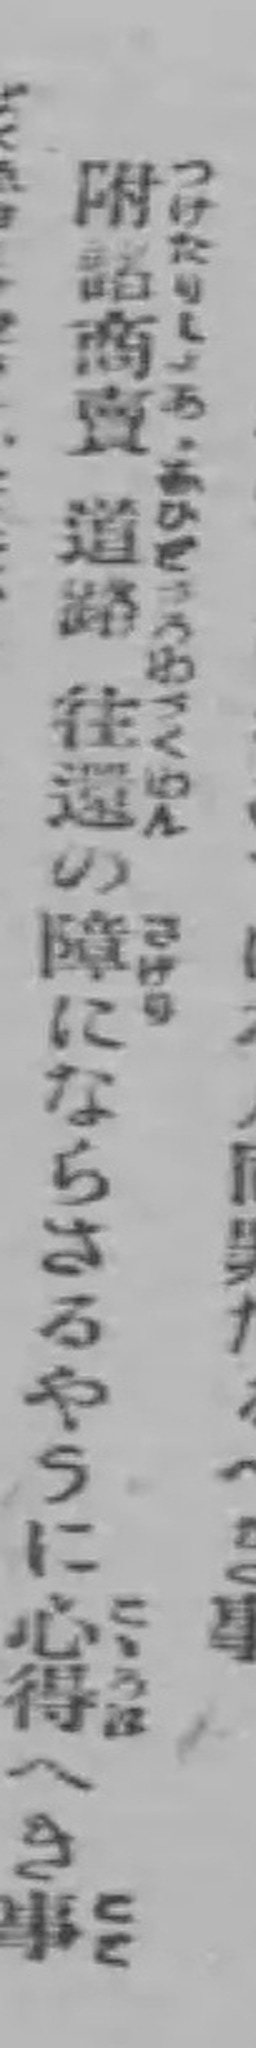附諸商売道路往還の障にならさるやうに心得へき事
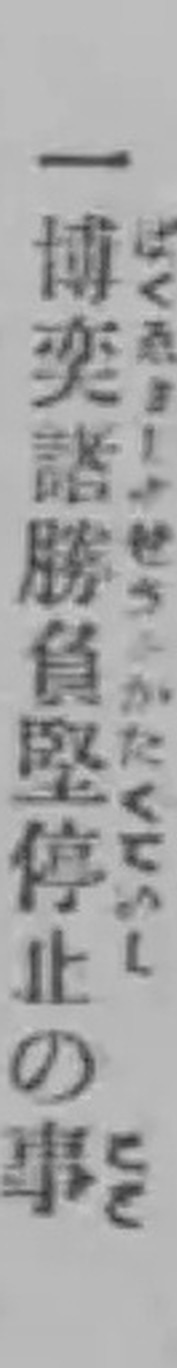一博奕諸勝負堅停止の事
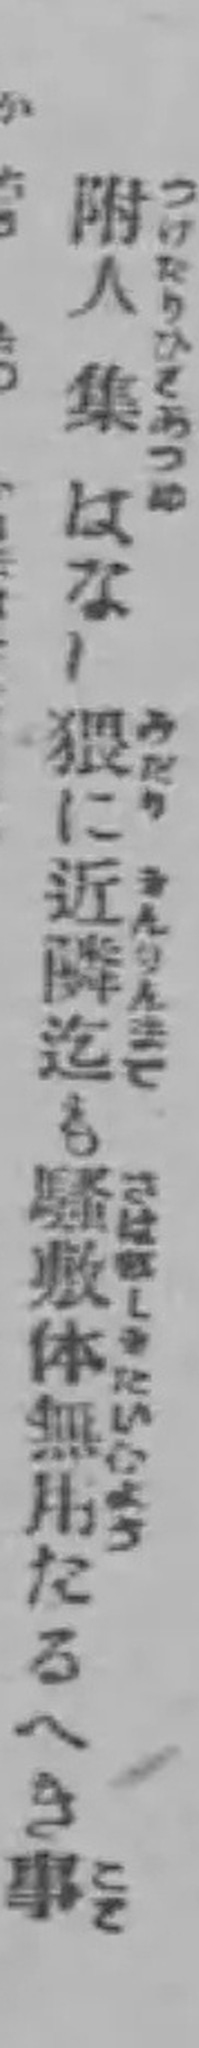附人集はなし猥に近隣迄も騒敷体無用たるへき事
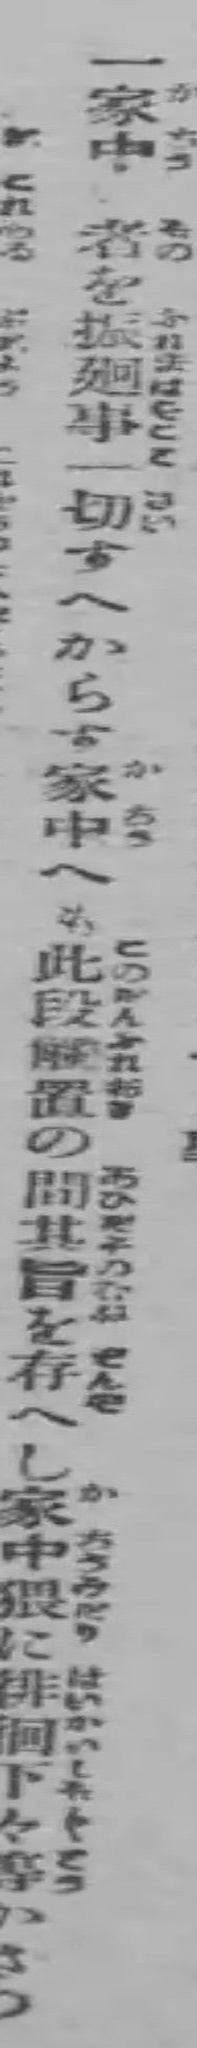一家中の者を振廻事一切すへからす家中へも此段触置の間其旨を存へし家中猥に徘徊下々等かさつ
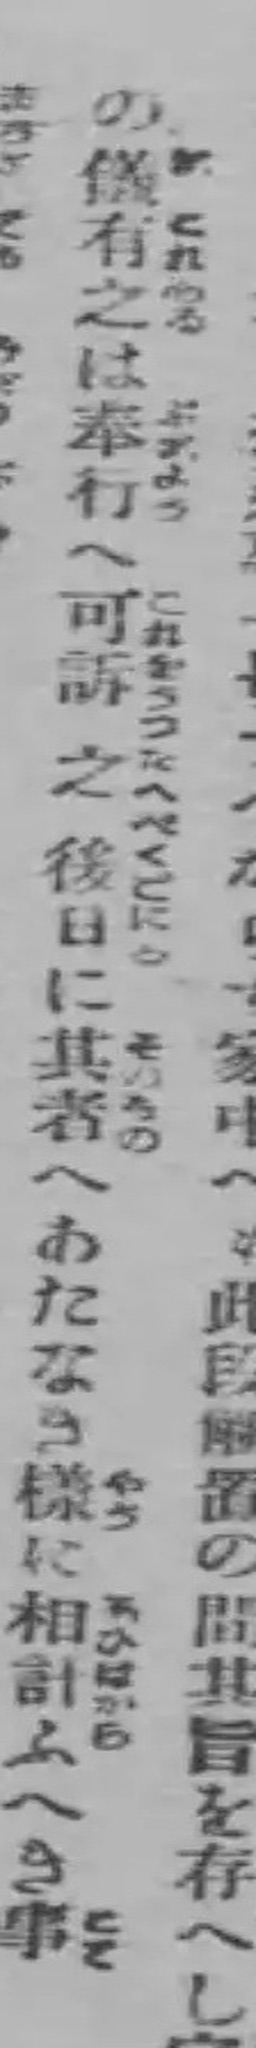の儀有之は奉行へ可訴之後日に其者へあたなき様に相計ふへき事
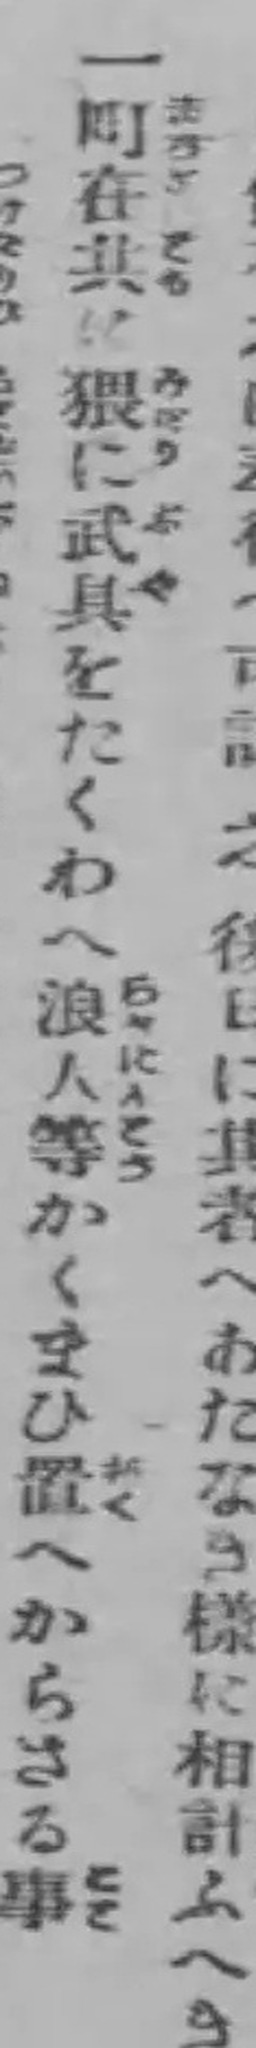一町在共に猥に武具をたくわへ浪人等かくまひ置へからさる事
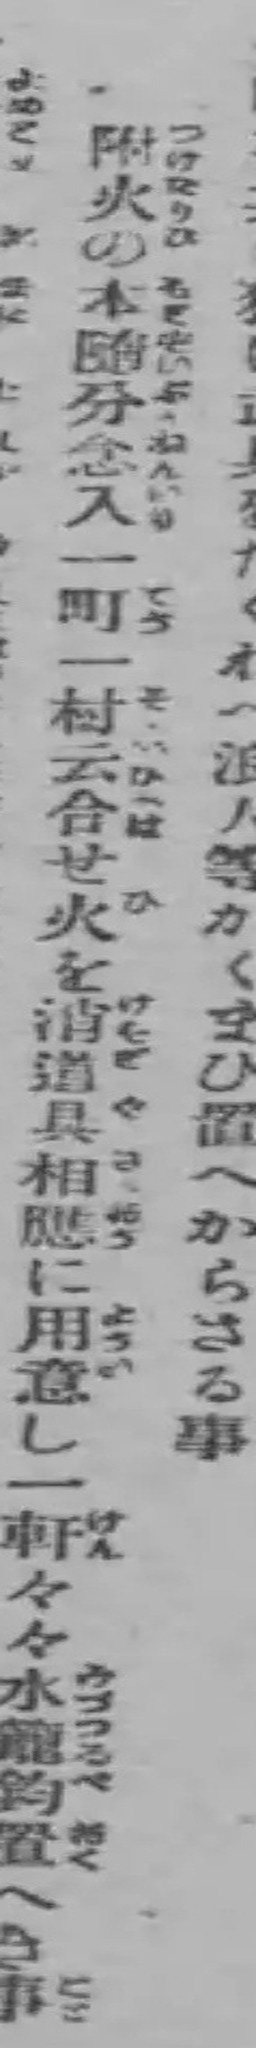附火の本随分念入一町一村云合せ火を消道具相応に用意し一軒々々水籠釣置へき事
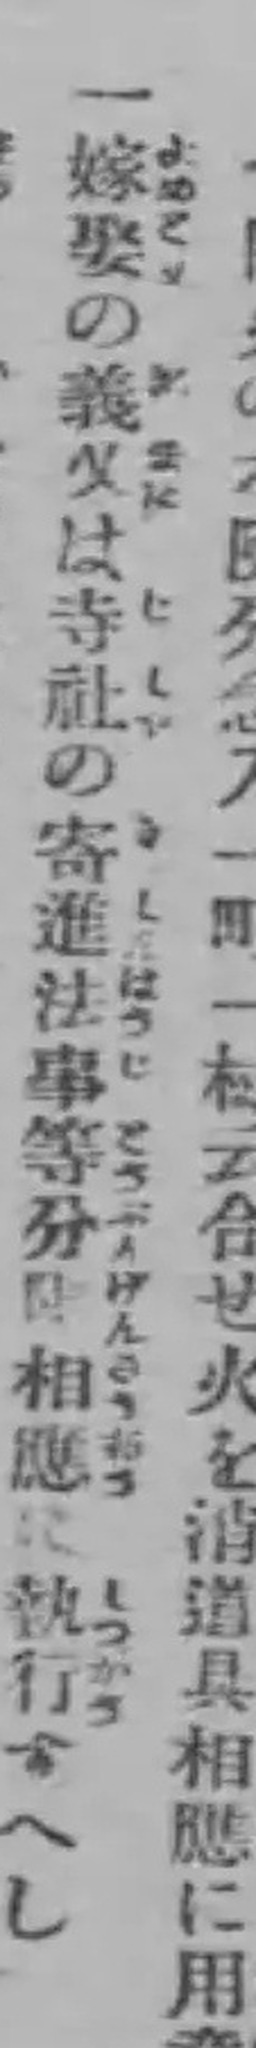一嫁娶の義又は寺社の寄進法事等分限相応に執行すへし
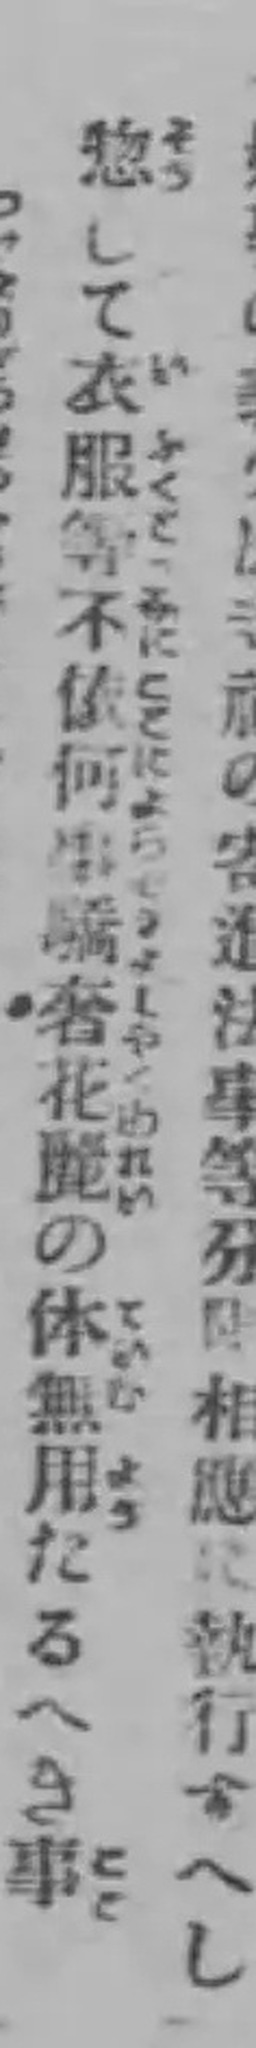惣して衣服等不依何事驕奢花麗の体無用たるへき事
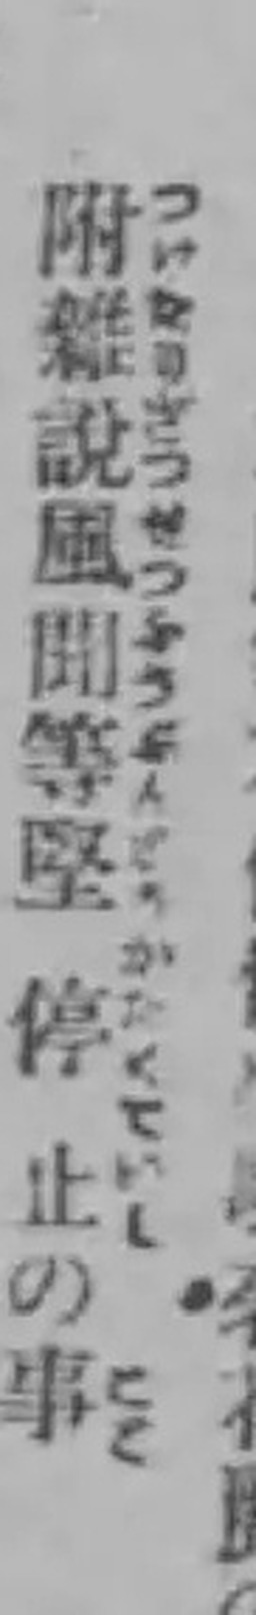附雑説風聞等堅停止の事
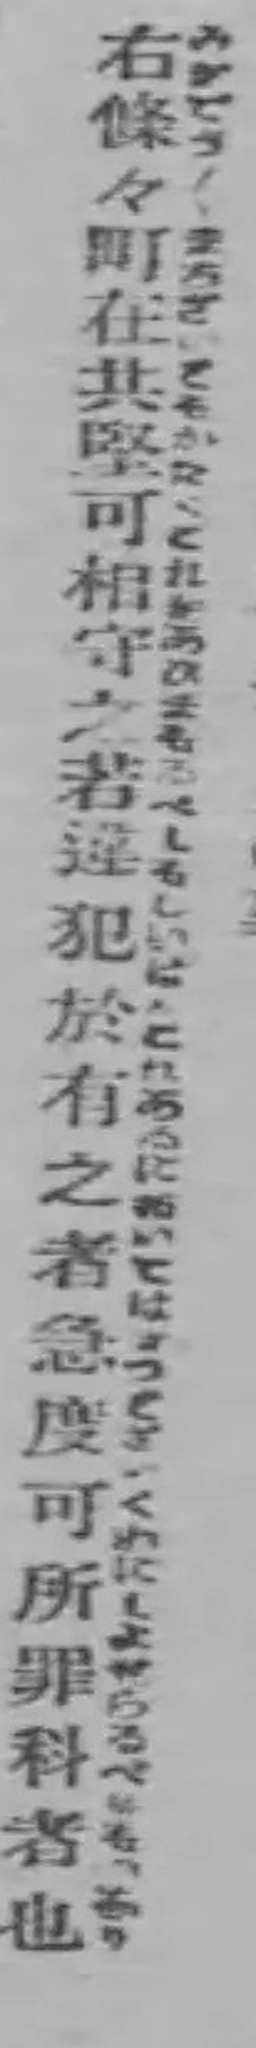右條々町在共堅可相守之若違犯於有之者急度可所罪科者也
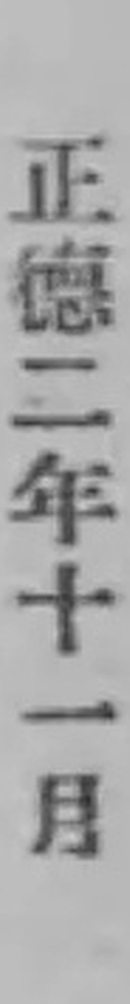正徳二年十一月
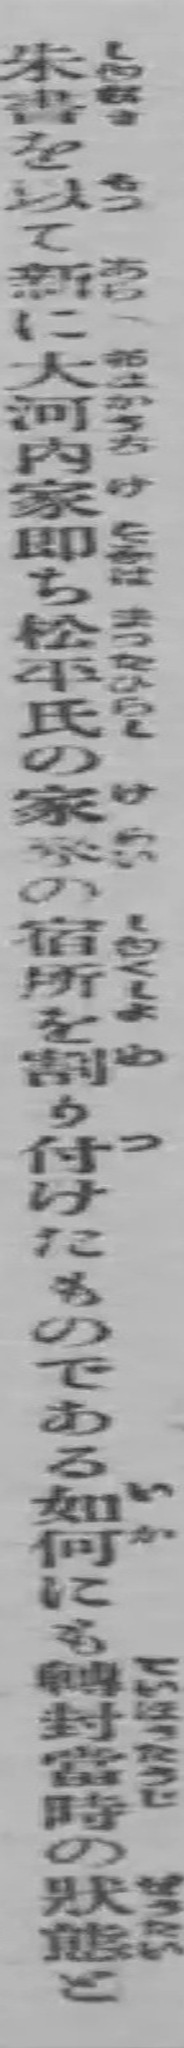朱書を以て新に大河内家即ち松平氏の家来の宿所を割り付けたものである如何にも転封当時の状態と
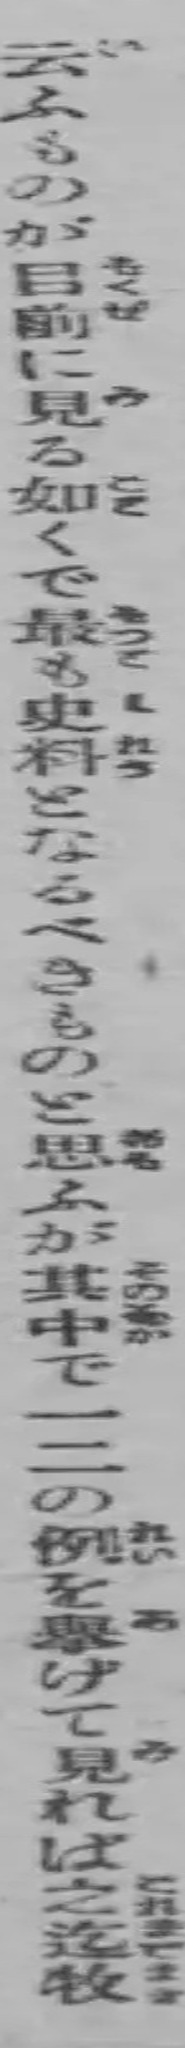云ふものが目前に見る如くで最も史料となるべきものと思ふが其中で一二の例を挙げて見れば之迄牧
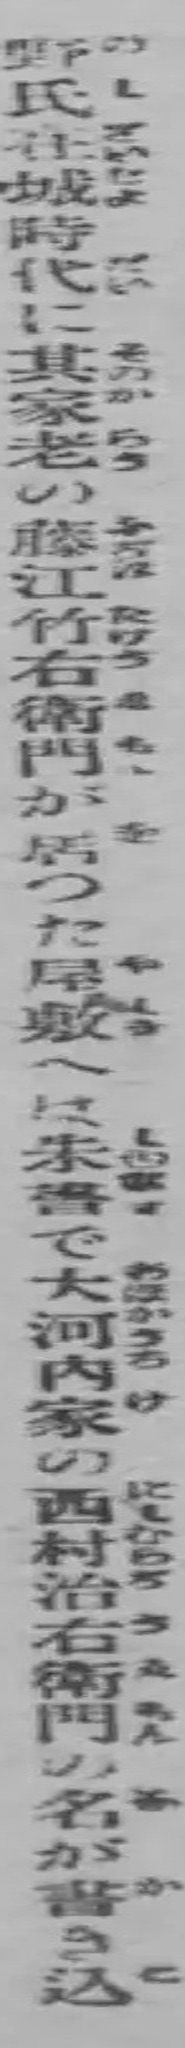野氏在城時代に其家老の藤江竹右衛門が居つた屋敷へは朱書で大河内家の西村治右衛門の名が書き込
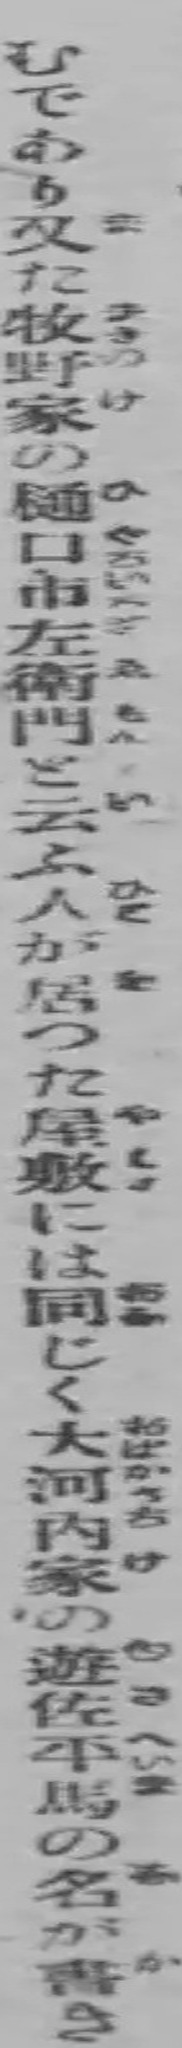むであり又た牧野家の樋口市左衛門と云ふ人が居つた屋敷には同じく大河内家の遊佐平馬の名が書き
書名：豊橋市史談
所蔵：国立国会図書館 National Diet Library, JAPAN
